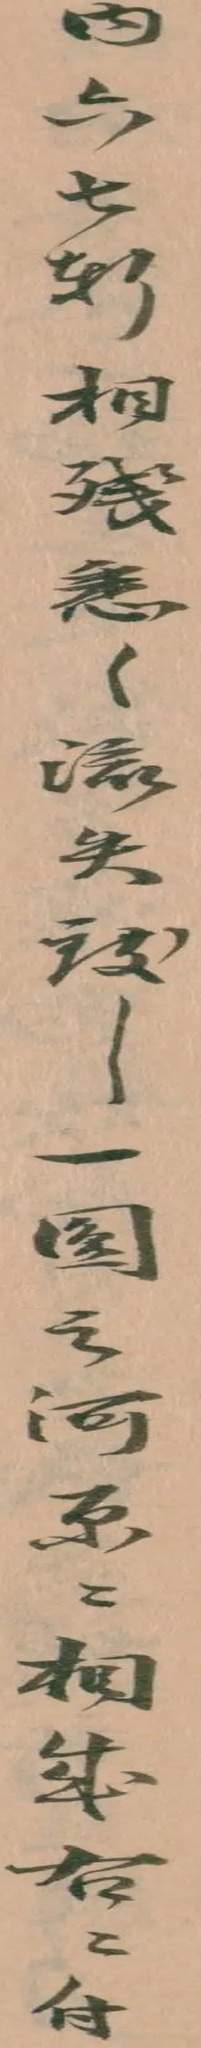内六七軒相残悉く流失致し一円之河原ニ相成右ニ付
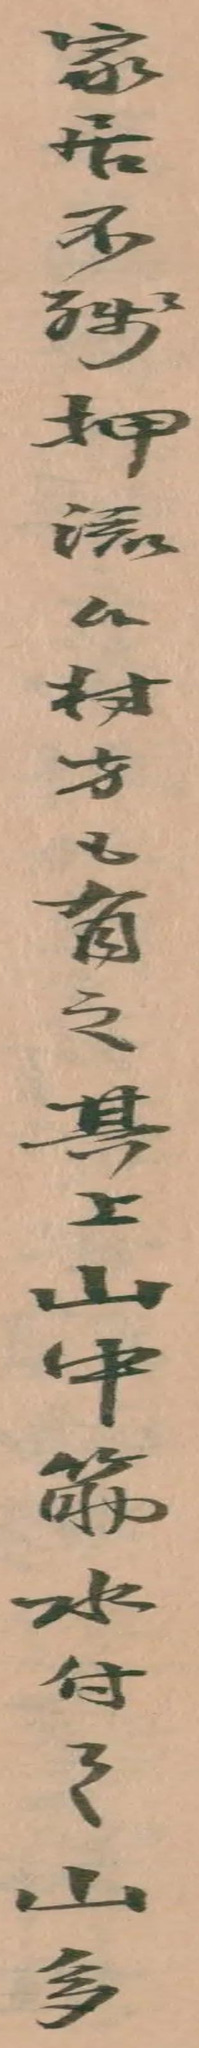家居不残押流候村方も有之其上山中筋水付之山多
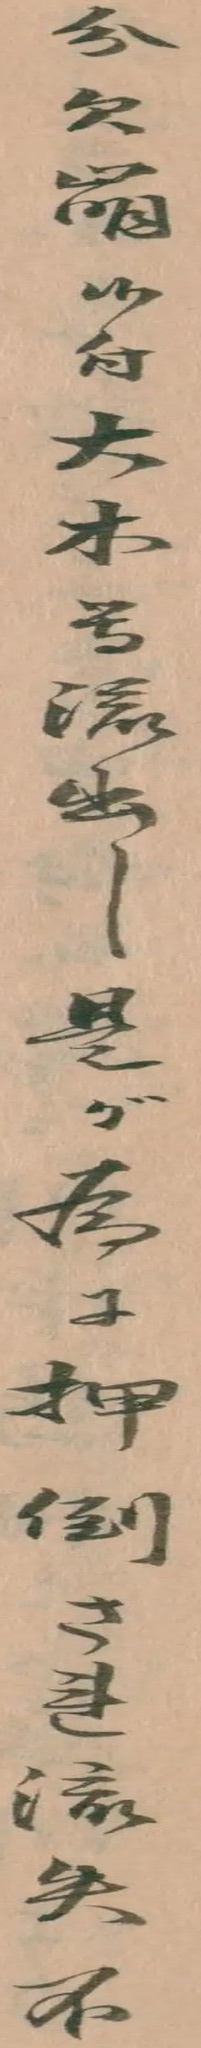分欠崩候付大木等流出是が為に押倒され致流失不
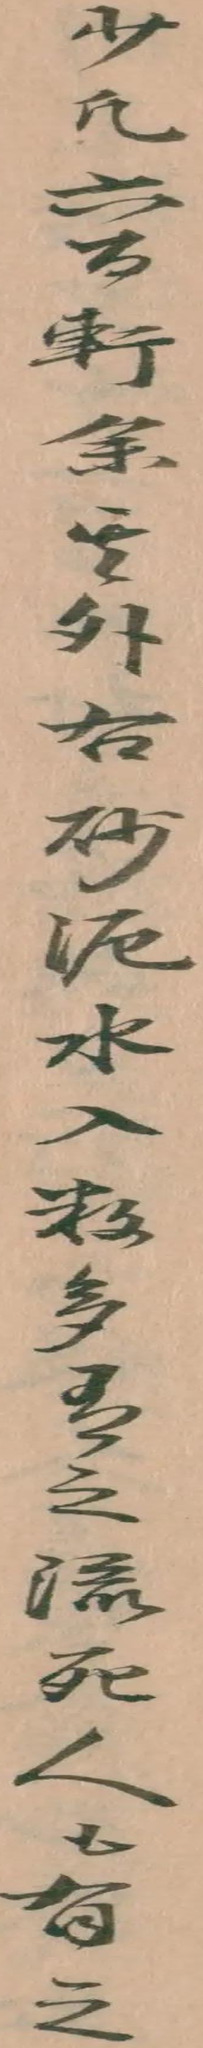少流凡六百軒余其外石砂泥水入数多有之流死人も有之
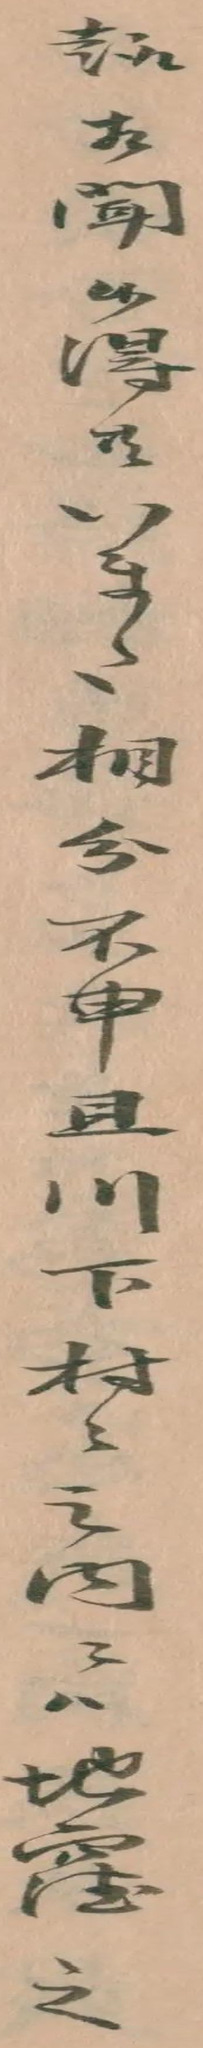趣相聞候得共いまた相分不申候且川下村々之内ニハ地窪之
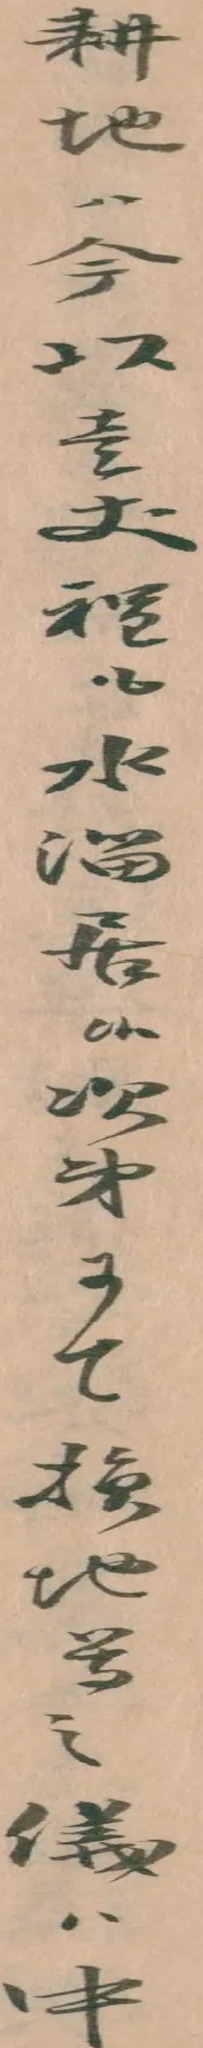耕地ハ今以壱丈程も水溜居候次第にて損地等之儀ハ中
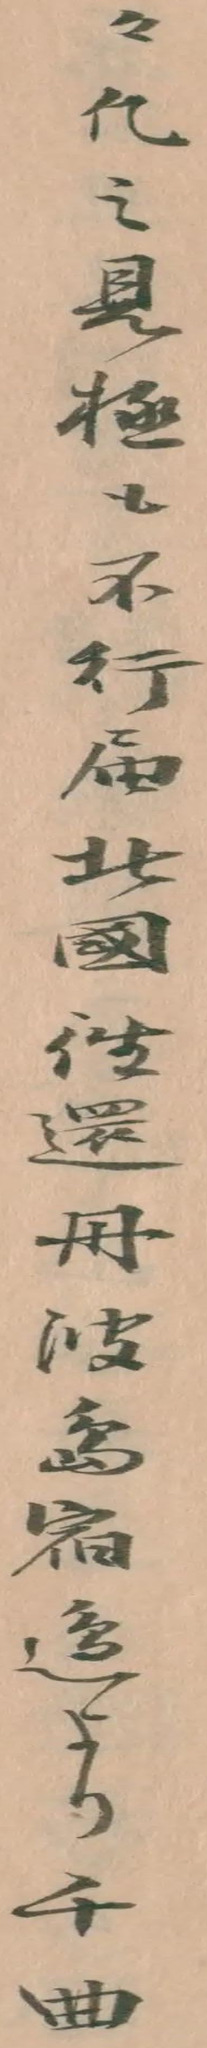々凡之見極も不行届北国往還丹波嶋宿辺ゟ千曲
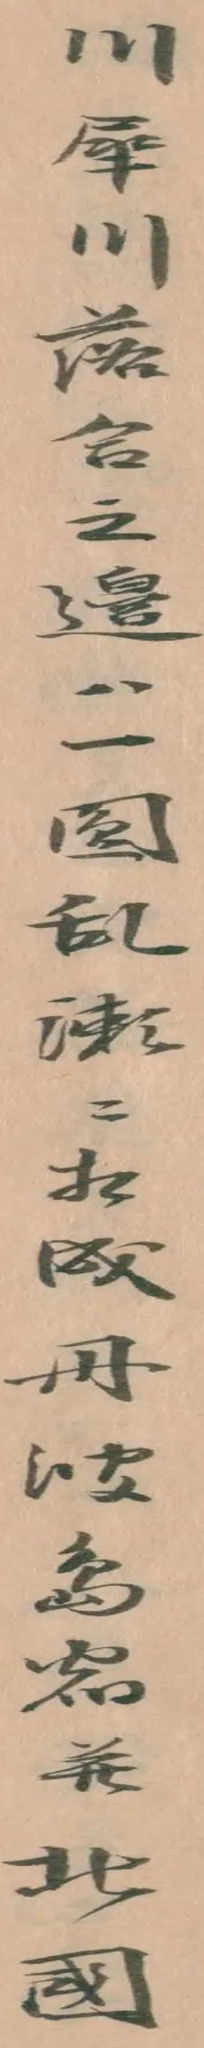川犀川落合之辺ハ一円乱瀬二相成丹波嶋宿并北国

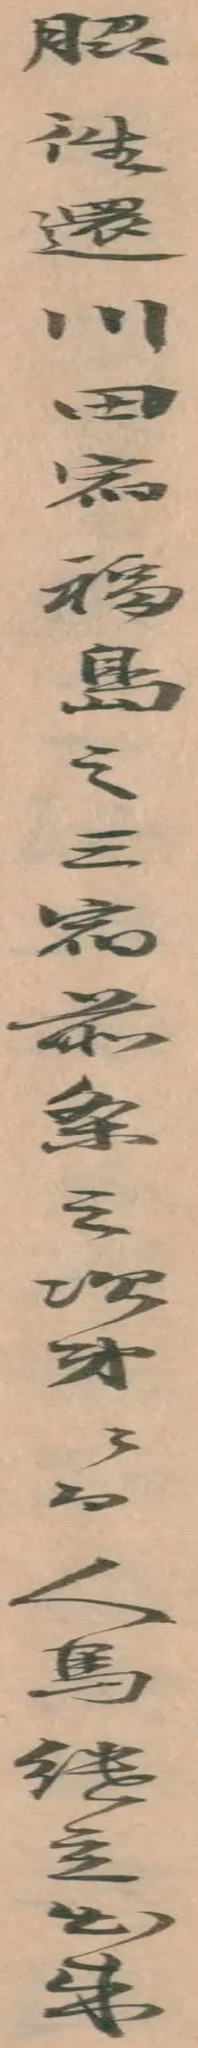脇往還川田宿福島宿之三宿前条之次第ニ而人馬継立出来
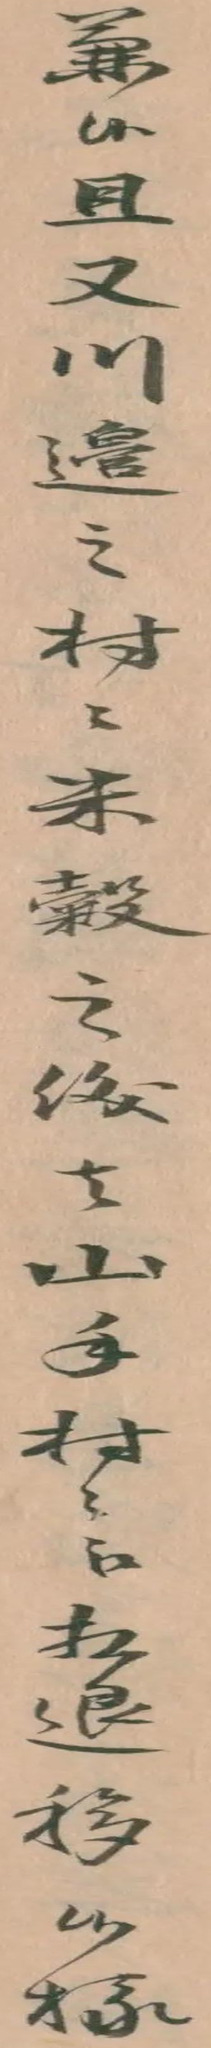兼候且又川辺之村々米穀之儀者山手村々江相退移候様
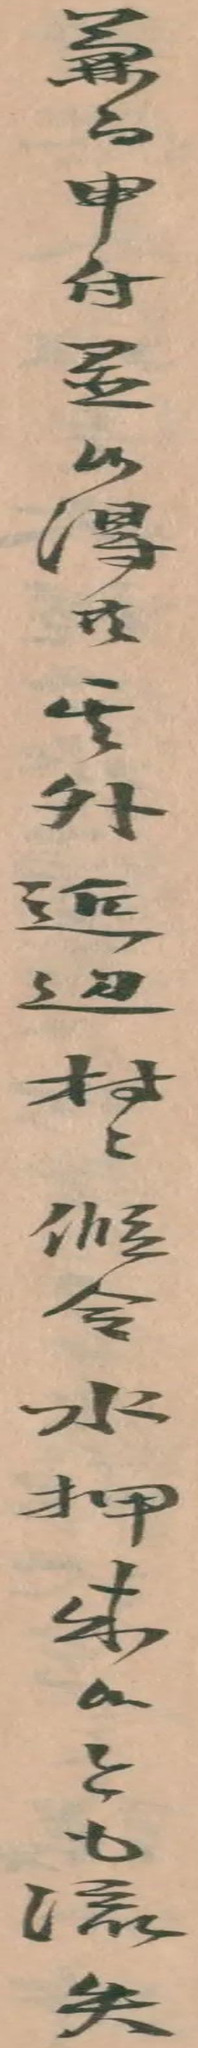兼而申付置候得共其外近辺近辺村々仮令水押来候とも流失
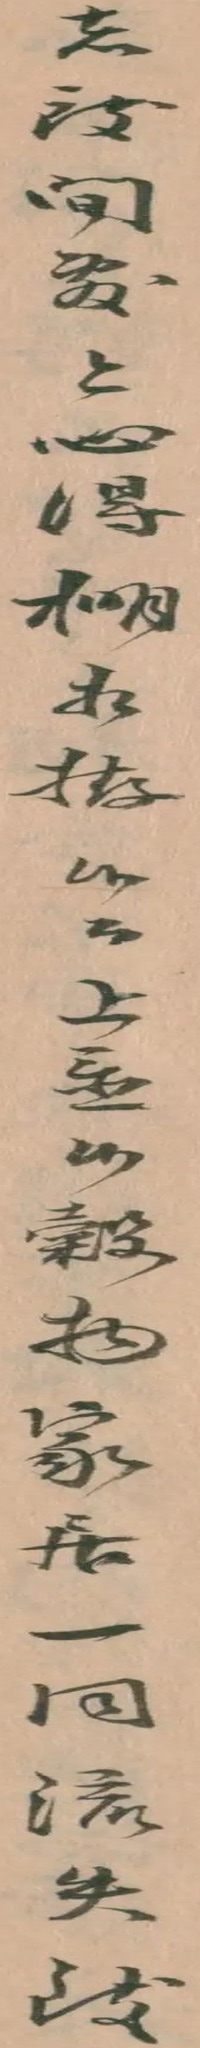者致間敷と心得棚相拵候而上置候穀物家居一同流失致
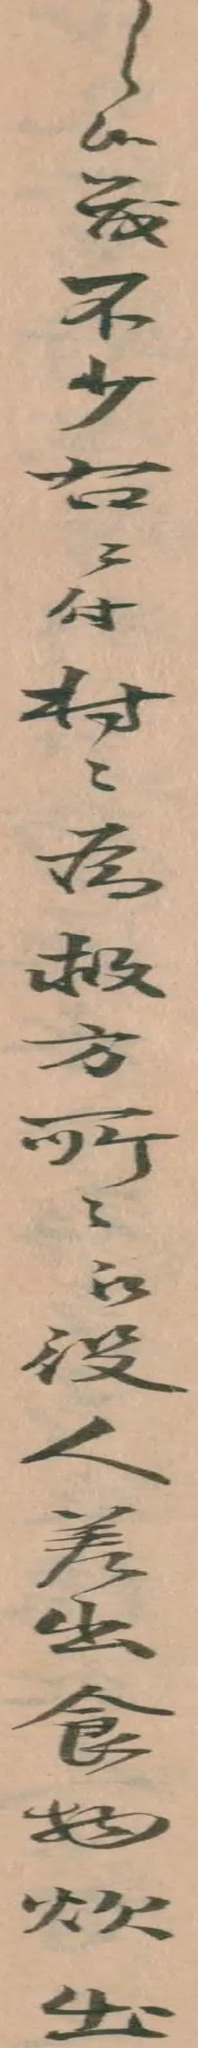し候も不少右ニ付村々為救方所々江役人差出食物炊出
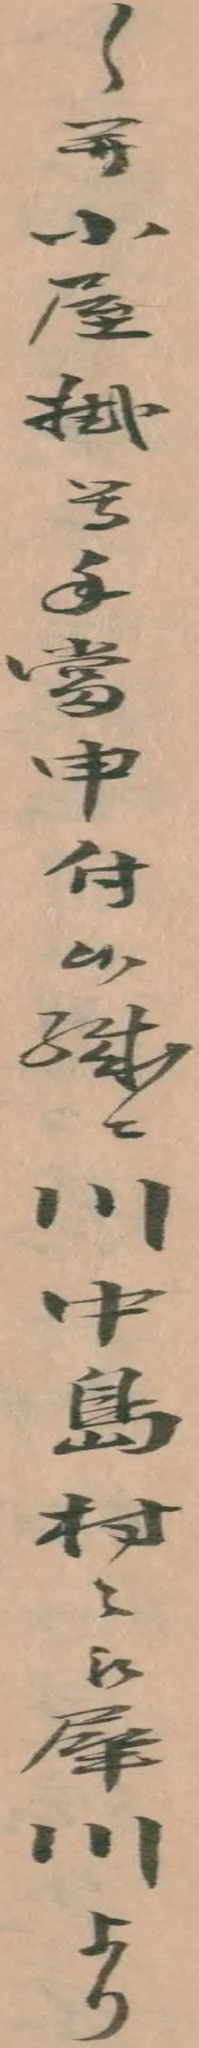し并小屋掛等手当等申付候殊ニ川中島村々江犀川より
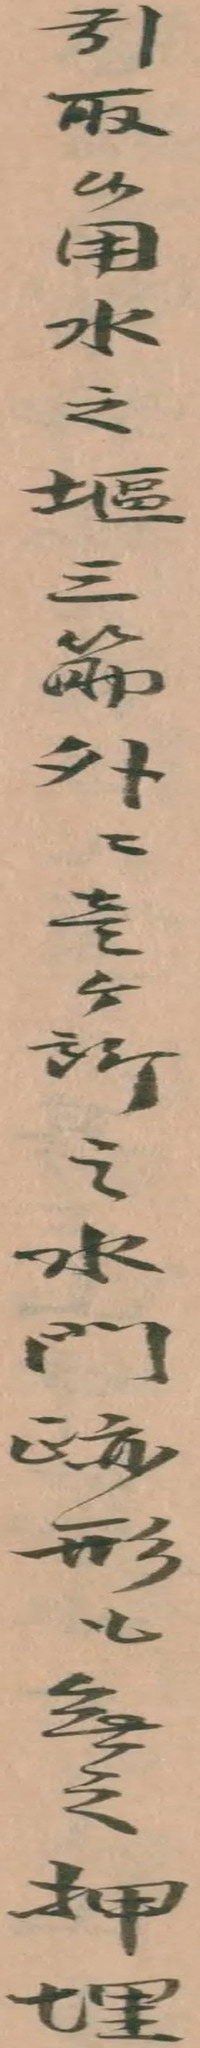引取候用水之堰三筋外ニ壱ケ所之水門跡形も無之押埋
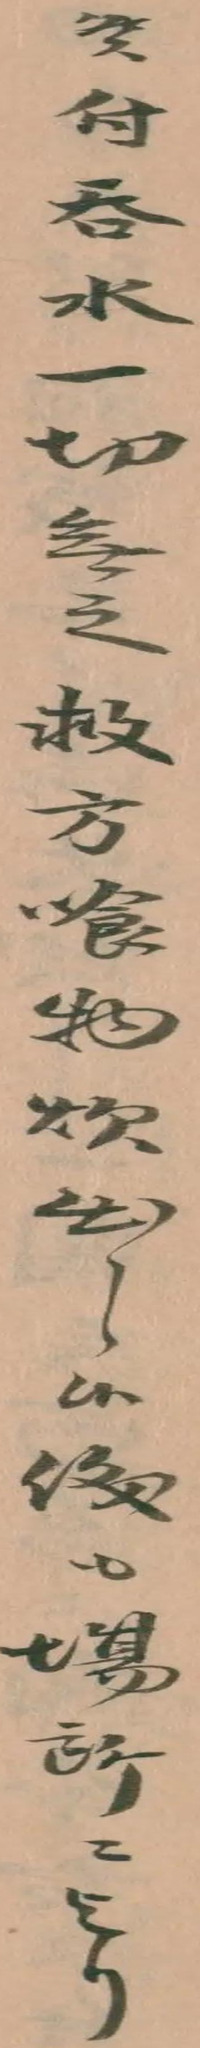候付呑水一切無之救方喰物炊出し候儀も場所二より
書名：地災撮要. 巻3(地震之部)-巻4(噴火之部)
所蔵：国立国会図書館 National Diet Library, JAPAN
